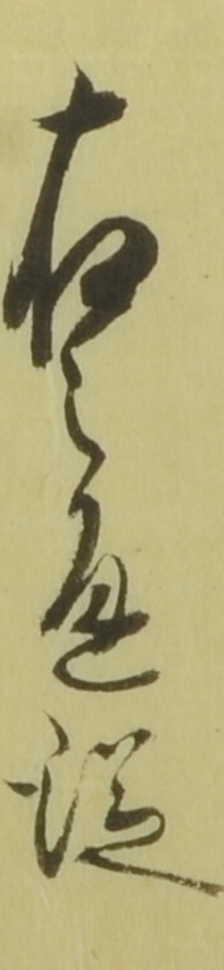右之通従
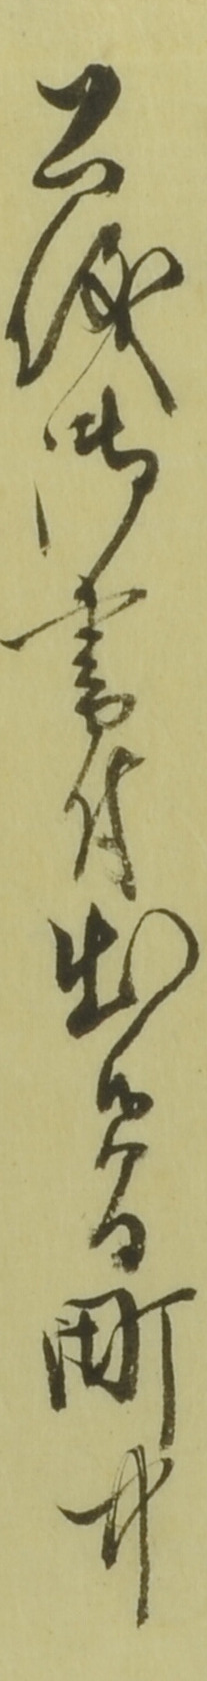公儀御書付出候間町中
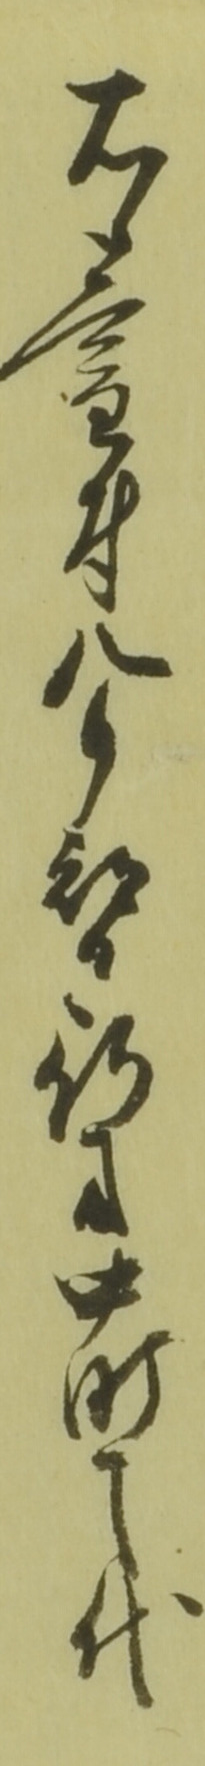右御書付八月朔日行司中町丁代
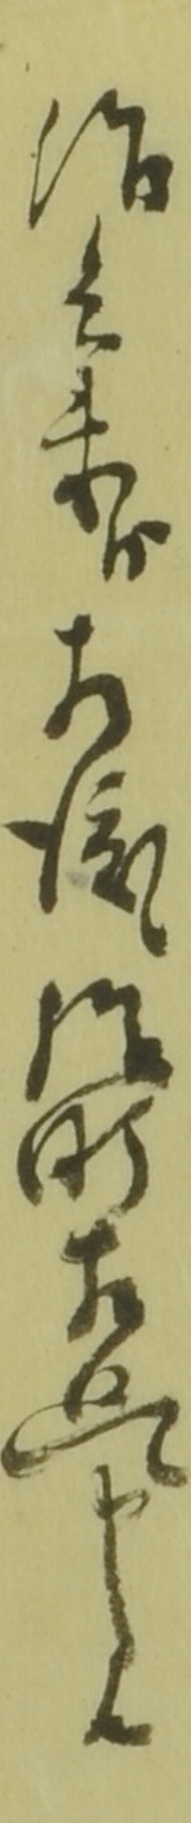治兵衛江相渡候拾町相廻シ申候
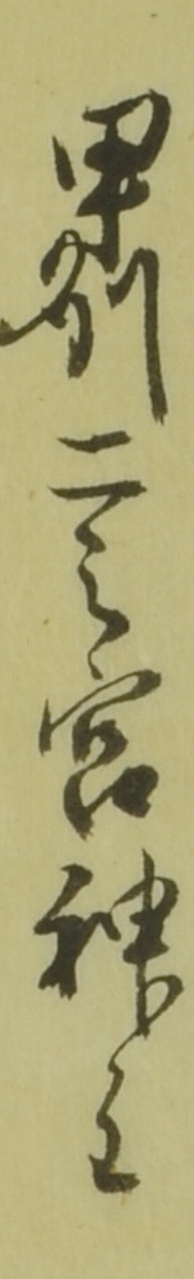甲州二之宮神主
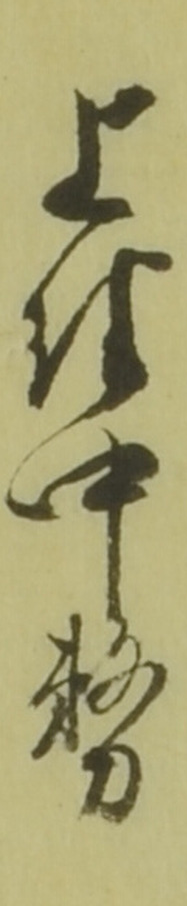上野中務
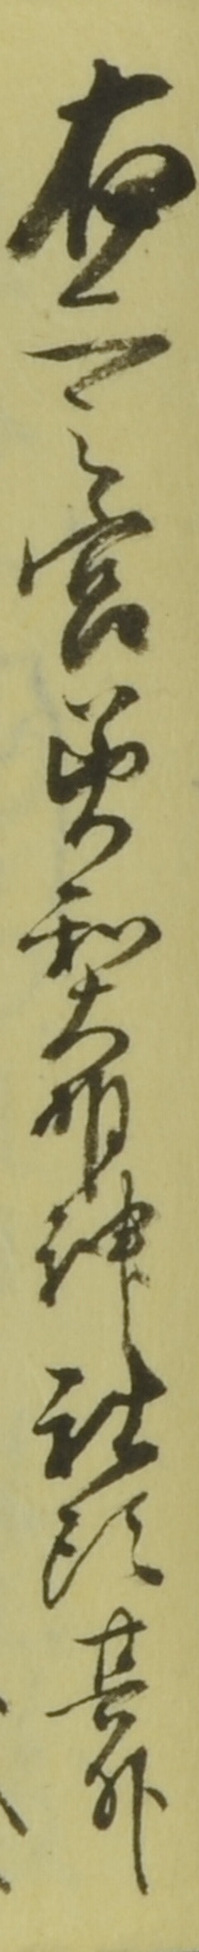右二之宮美和大明神社頭其外
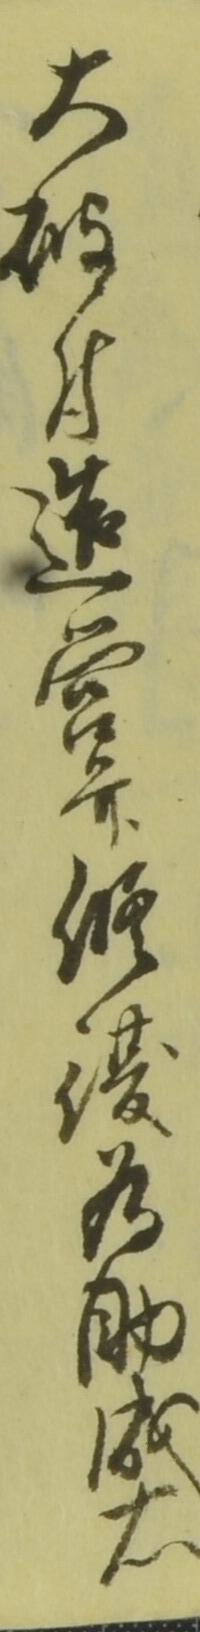大破付造営并修復為助成右
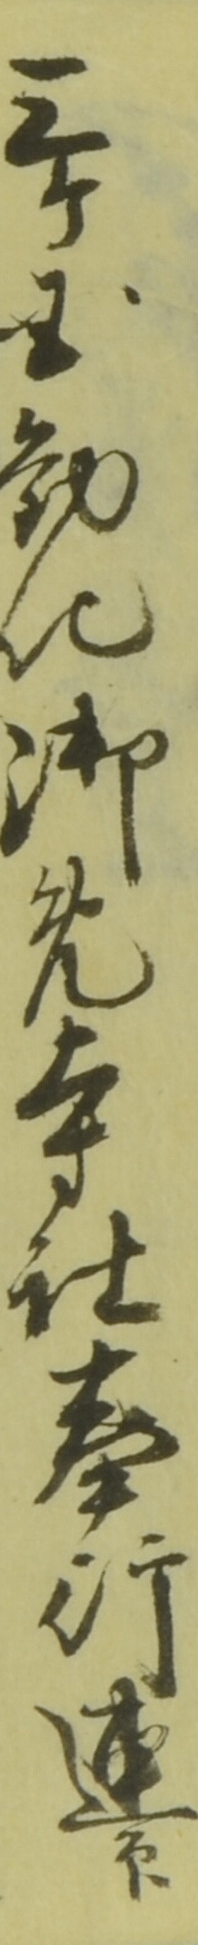三ヶ国勧化御免寺社奉行連印

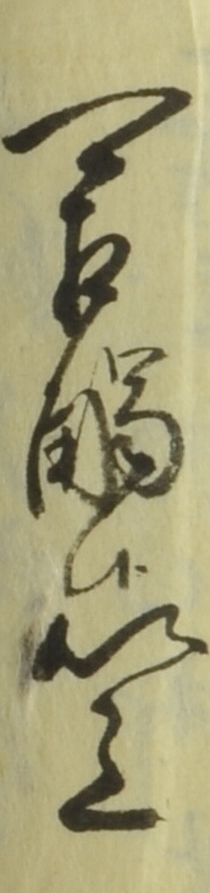可相触候以上
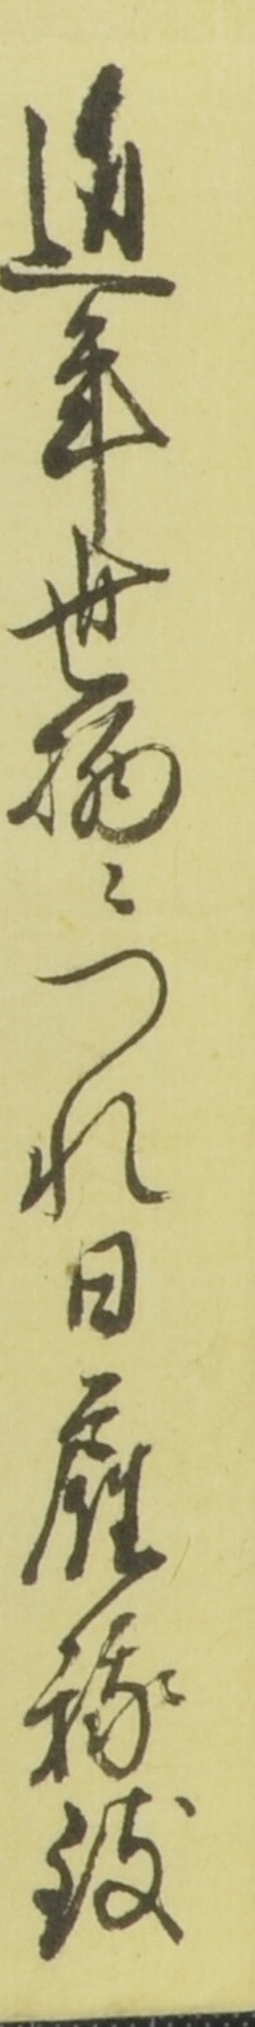近年世柄ニつれ日雇稼致
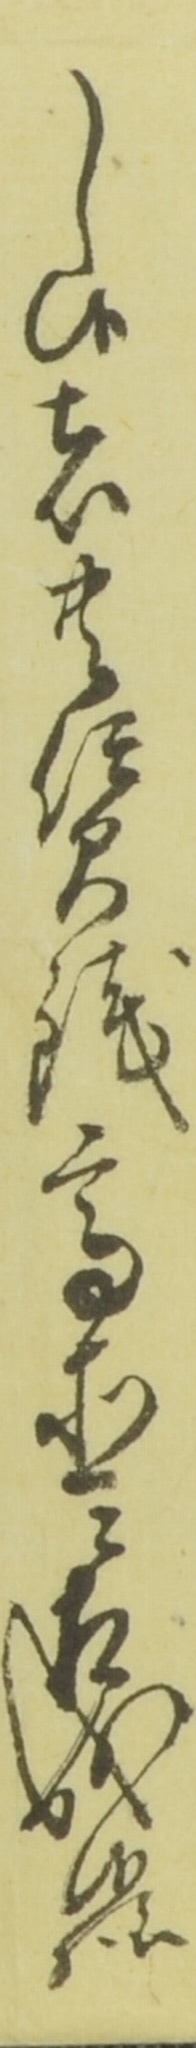之候者共賃銭高直ニ相成候様
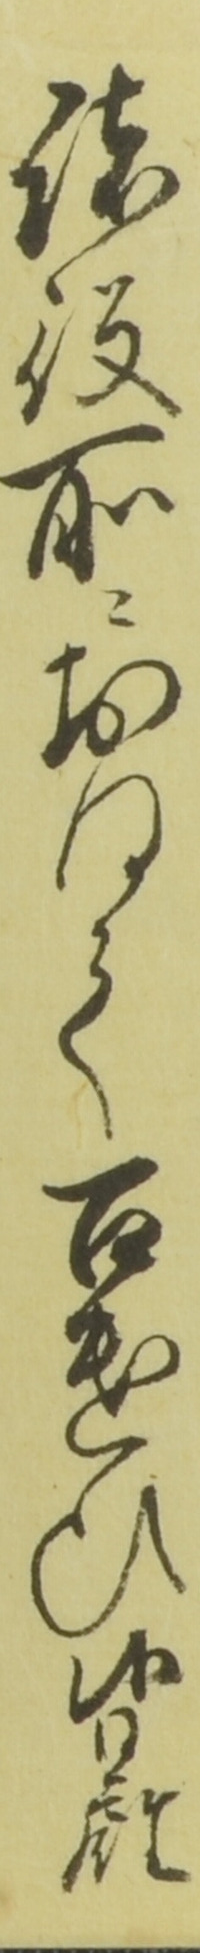諸役所ニおゐて召遣ひ候日雇
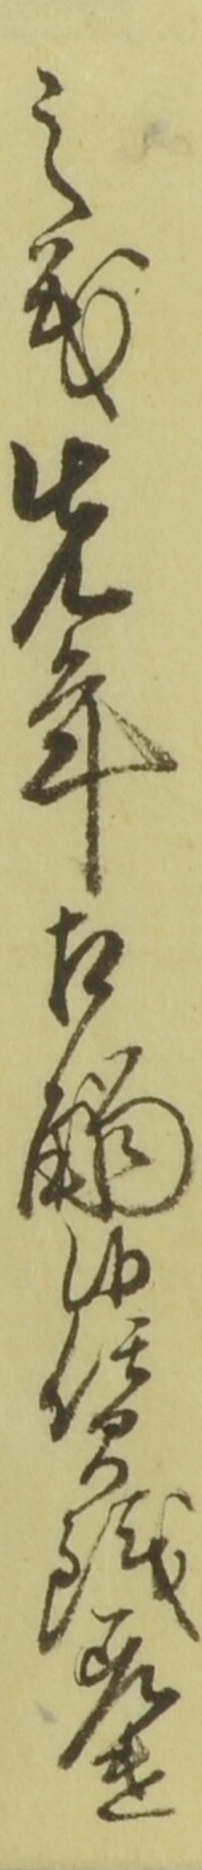之義先年相触候賃銭差遣
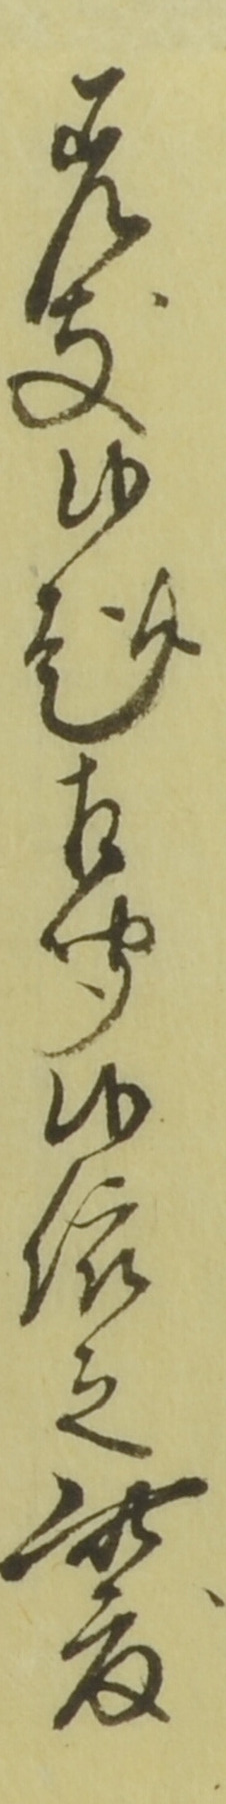差支候趣相聞候依之此度
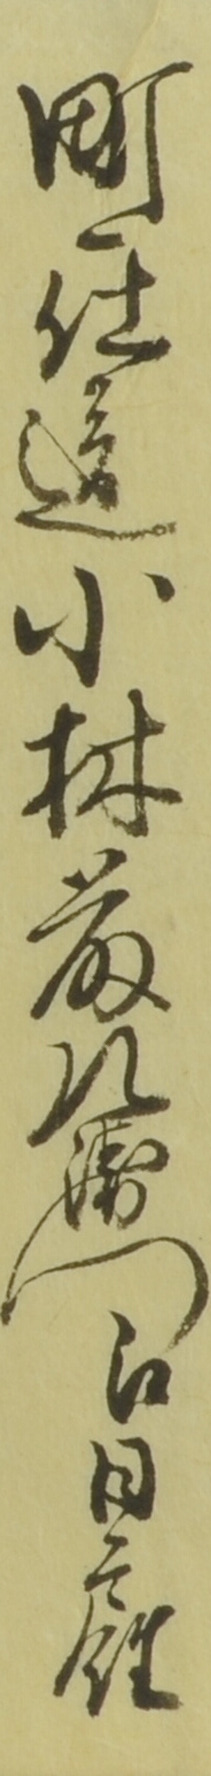町へ仕送小林藤左衛門江日雇
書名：御触書御書附控
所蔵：伊那市立高遠町図書館・合同会社AMANE
